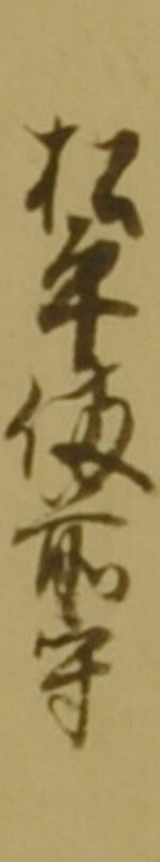松平備前守
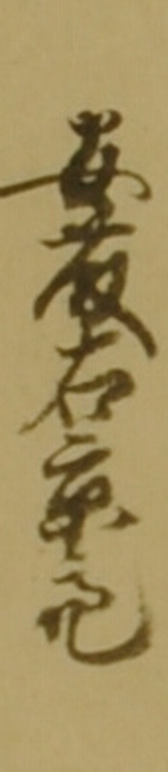安藤右京亮
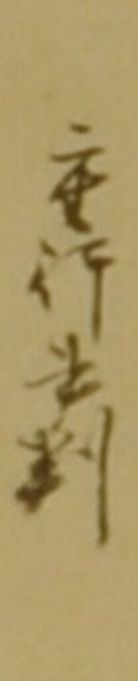重行書判
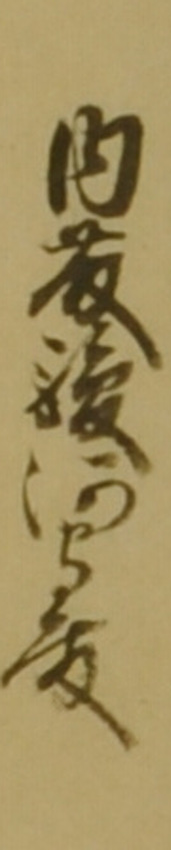内藤駿河守殿
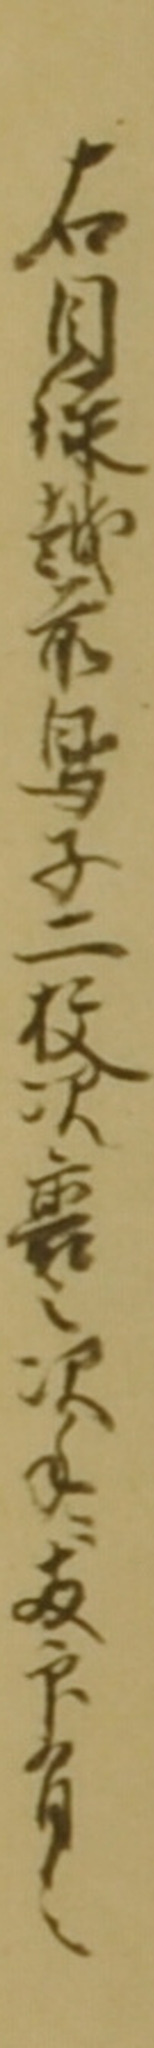右目録越前鳥子二枚次裏之次手ニ両印有之

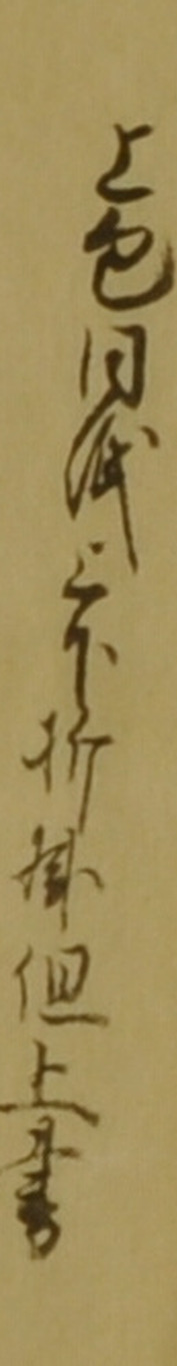上包同紙上下折掛但上書
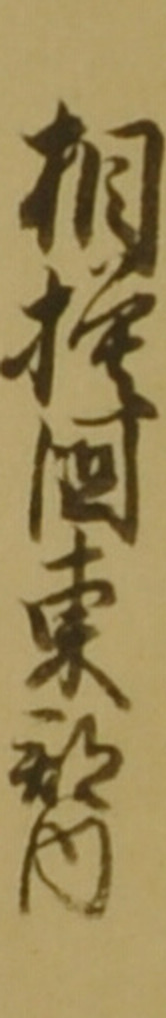相模国東郡内
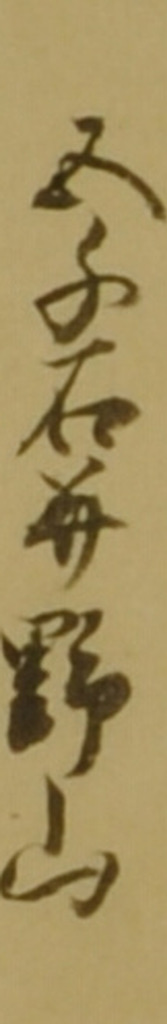五千石幷野山
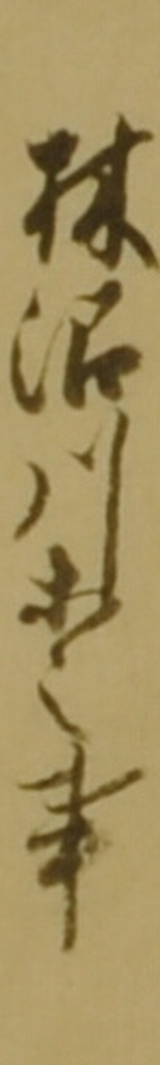林沼川等之事
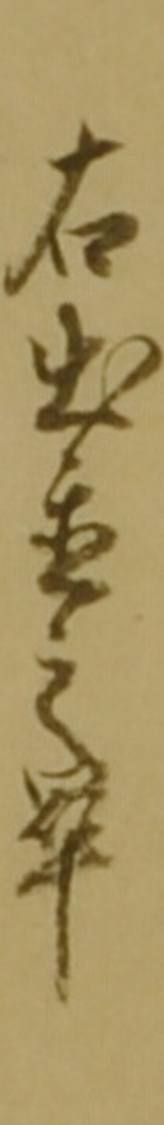右出置之畢
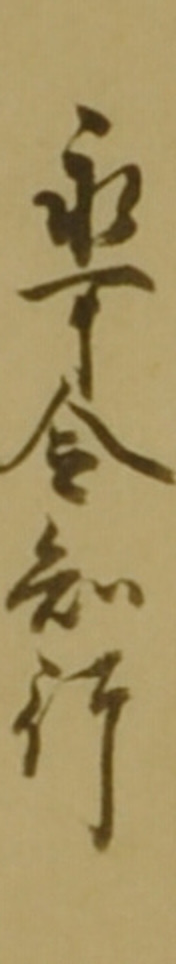永可令知行
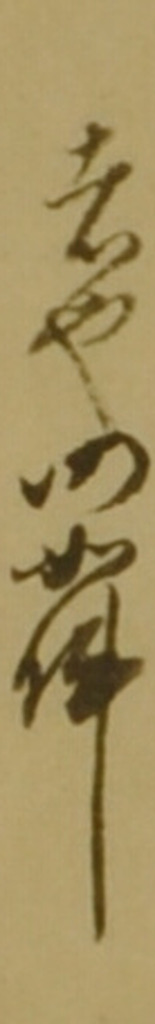者也仍如件
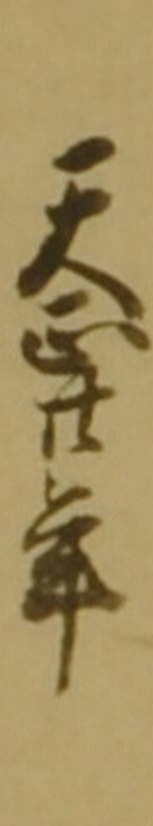天正廿年
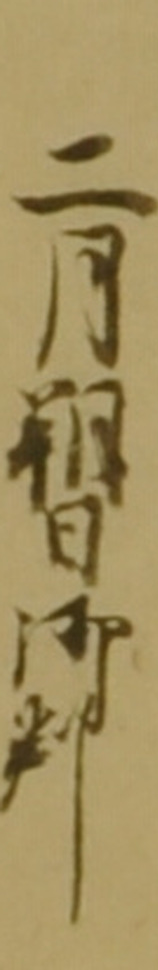二月朔日御判
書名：御朱印・領地目録写
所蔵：伊那市立高遠町図書館・合同会社AMANE
